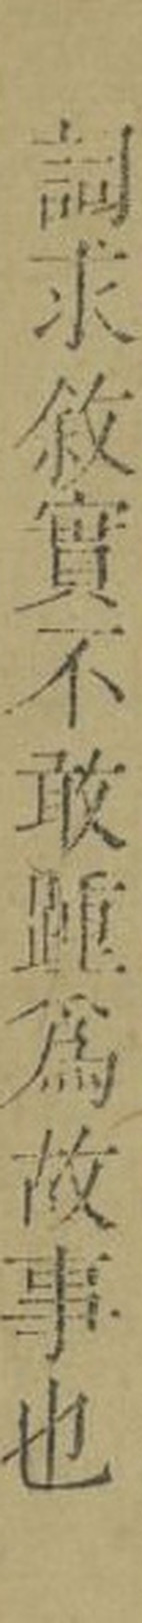詞求敘實不敢踵爲故事也
